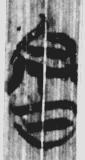舍
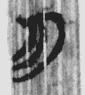勿
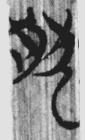肰（然）
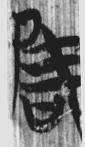唯（雖）
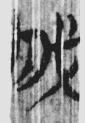我
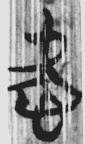○（愛）
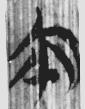尔（爾）
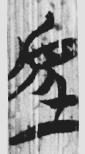○（吾）
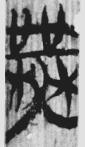無
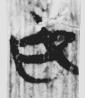女（如）
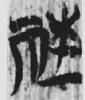○（社）
